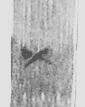五
